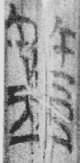箸
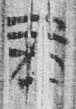不
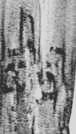與
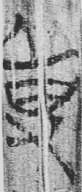事
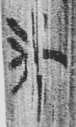之
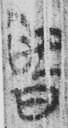智（知）
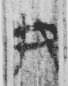四
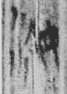海
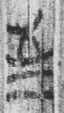至
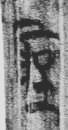聖（聽）
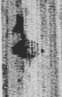千
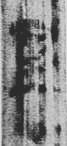里
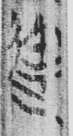達
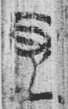見
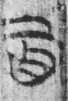百
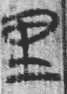里
